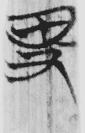卑
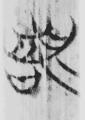若
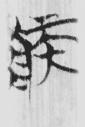疾
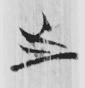之
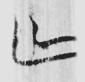亡
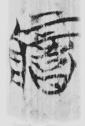{疒意}
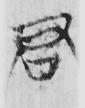君
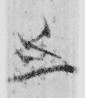之
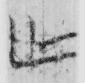亡
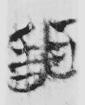䎽
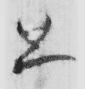也
